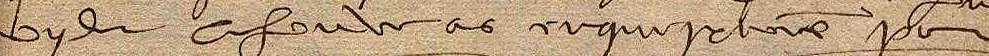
vydor e houve as enqueryções pro
